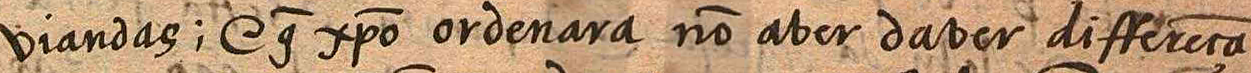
viandas; e q̅ xp̅o ordenara n̅o aver daver differ̅eça
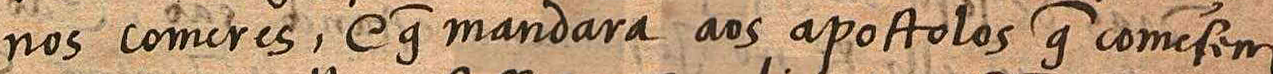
nos comeres, e q̅ mandara aos apostolos q̅ comesem
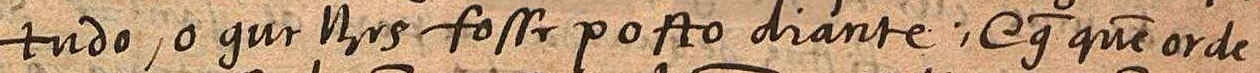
tudo, o que lhes fosse posto diante; e q̅ qu̅e orde
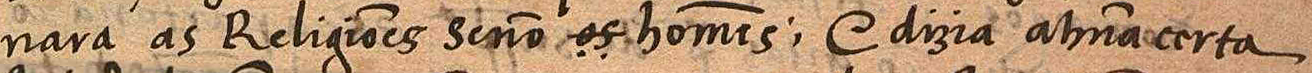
nara as Religio̅es sen̅o os ho̅mes; e dizia a hu̅a certa
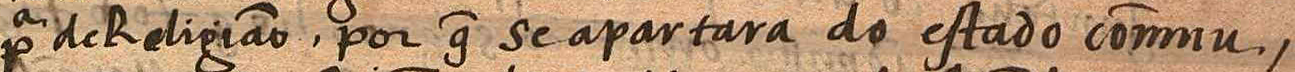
pa de Religia̅o, por q̅ se apartara do estado co̅mmu./
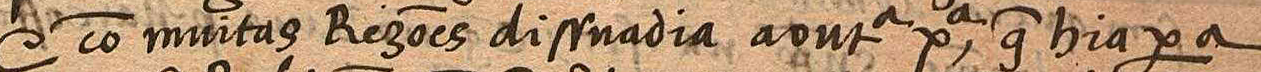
e c̅o muitas Rezões dissuadia a outa pa, q̅ hia ꝑa
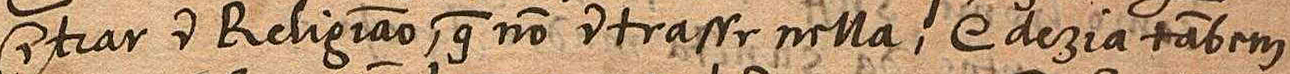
e̅trar e̅ Religião, q̅ no̅ e̅trasse nella, e dezia ta̅bem
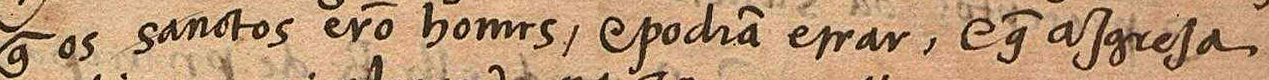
q̅ os sanctos ero̅ homes, e podia̅ errar, e q̅ a JgreJa
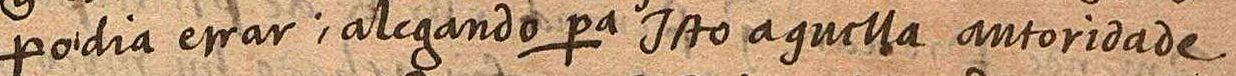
podia errar; alegando ꝑa Jsto aquella autoridade
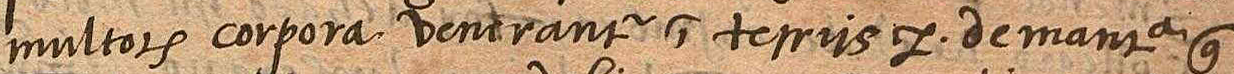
multoc̅ꝭ corpora venerant~ i̅ terrijs ꝑ. de manra q̅
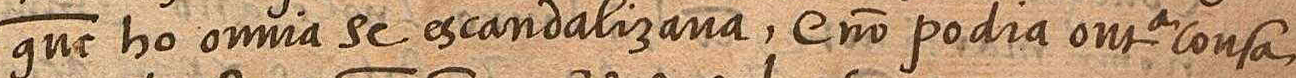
q̅ue ho ouuia se escandalizaua, e n̅o podia outa cousa
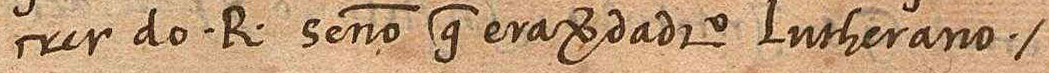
crer do .R. sen̅o que era ꝟdadro Lutherano./
